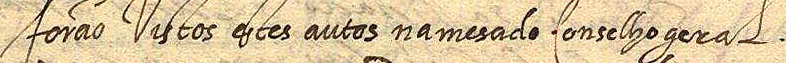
forão Vistos estes autos na mesa do Conselho geraL
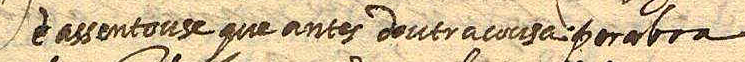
e assentouse que antes doutra cousa: por a boa
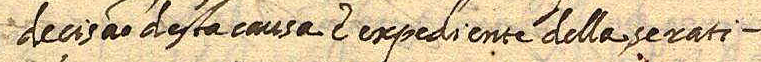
deçisão desta causa e expediente della, se rati
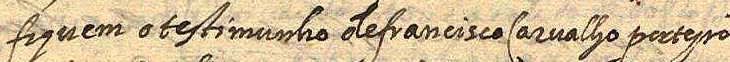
fiquem o testimunho de francisco Carualho portejro
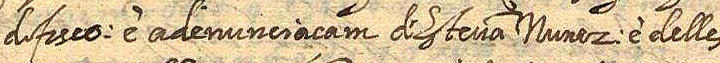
do fisco: e a denunciacam de Esteuā Nunez: e delles
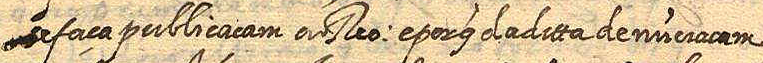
se faça publicaçam ao Reo: e porq̄ da ditta denūciacam
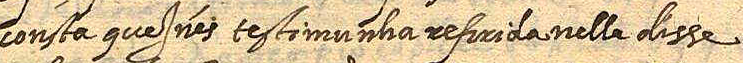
consta que Jnes testimunha refirida nella disse
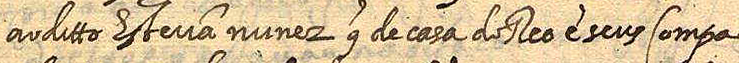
ao ditto Esteuā nunez q̄ de casa do Reo e seus Compa
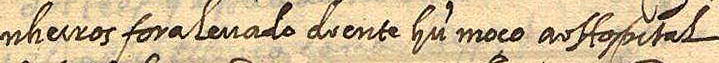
nheiros fora leuado doente hū moço ao HospitaL,
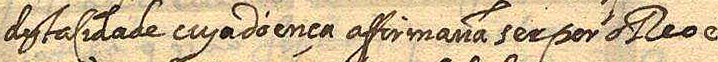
desta Cidade cuja doença affirmauā ser por o Reo e
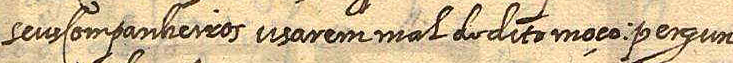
seus Companheiros usarem mal do dito moço: pergun
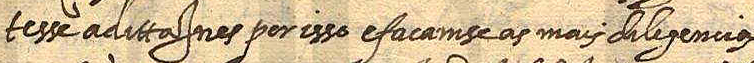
tesse a ditta Jnes por isso e facamse as mais diligencias
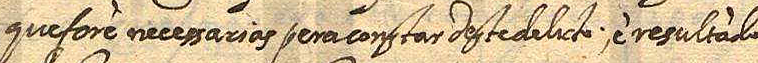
que forē necessarias pera constar deste delicto; e resultādo
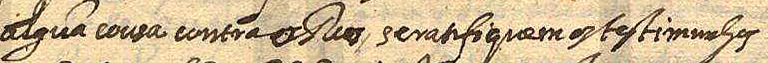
alguā cousa contra o Reo, se ratifiquem os testimunhos.
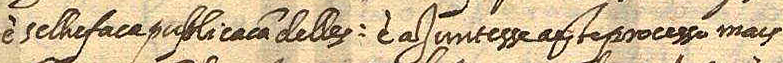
e se lhe faca publicacā delles: e aJuntesse a este processo mais
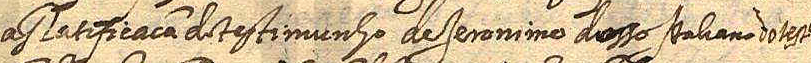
a Ratificacā do testimunho de Jeronimo dosso Jtaliano do testo
